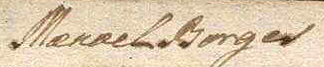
Manoel Borges
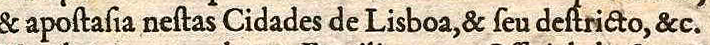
& apostasia nestas Cidades de Lisboa, & seu destricto, &c.
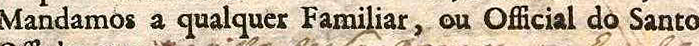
Mandamos a qualquer Familiar, ou Official do Santo
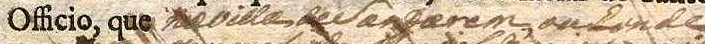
Officio, que na villa de Santarem, ou honde
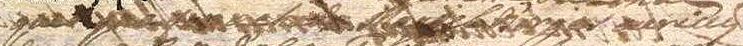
quer que for achado Manuel Borges ouriues
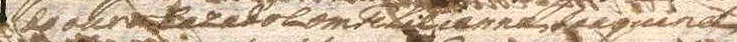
do ouro cazado com Felicianna Ioaquina
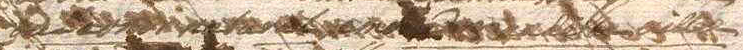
natural e morador nesta villa
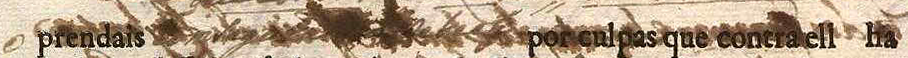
o prendais com seg___sete por culpas que contra ell ha
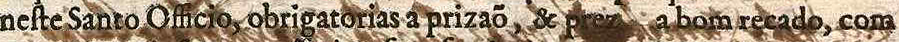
neste santo Officio, obrigatorias a prizaõ, & prez a bom recado, com
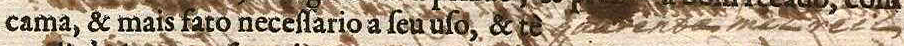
cama, & mais fato necessario a seu uso, & tè quarenta mil reis
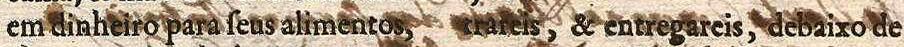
em dinheiro para seus alimentos, trareis, & entregareis, debaixo de
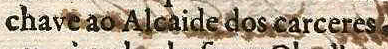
chave ao Alcaide dos carceres
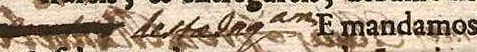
desta Inqam E mandamos
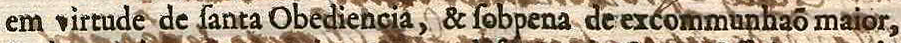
em virtude de santa Obediencia, & sob pena de excommunhaõ maior,
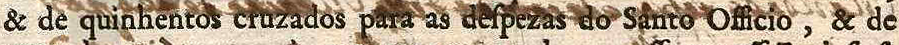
& de quinhentos cruzados para as despezas do Santo Officio, & de
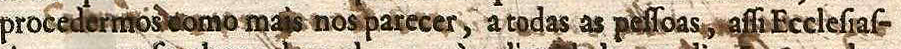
procedermos como mais nos parecer, a todas as pessoas, assi Ecclesias
